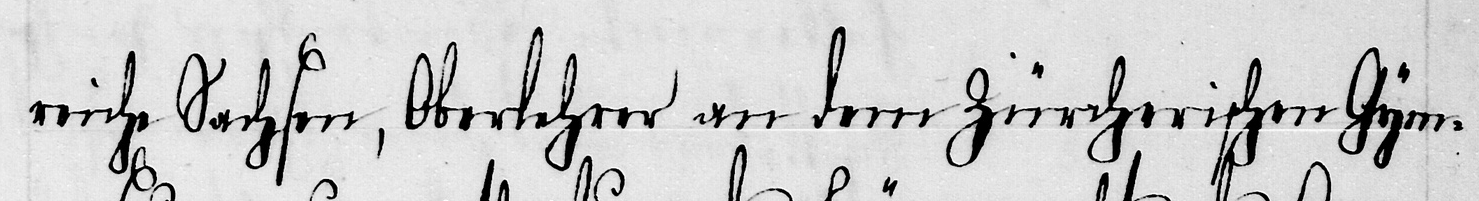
reiche Sachsen, Oberlehrer an dem Zürcherischen Gym¬
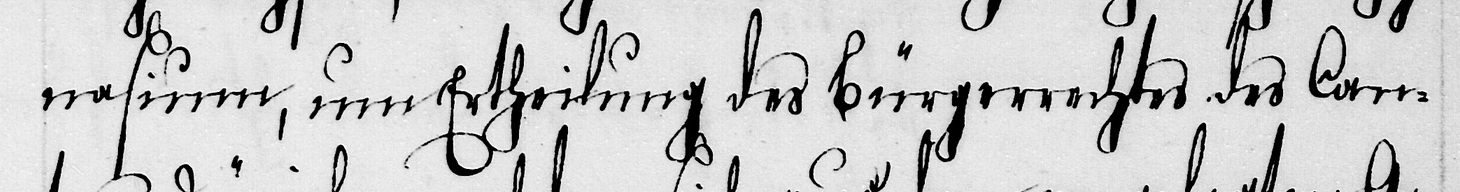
nasium, um Ertheilung des Bürgerrechtes des Can¬
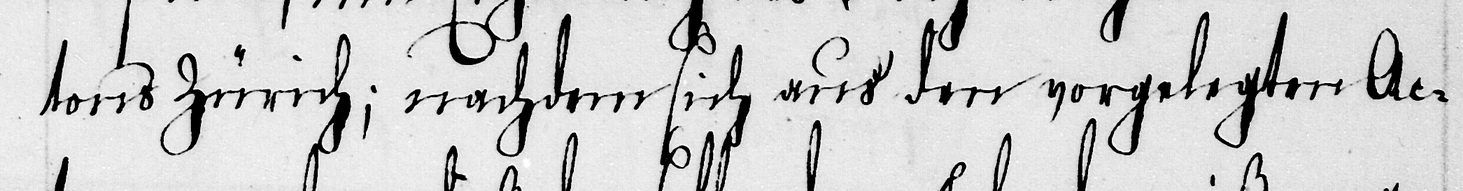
tons Zürich; nachdem sich aus den vorgelegten Ac¬
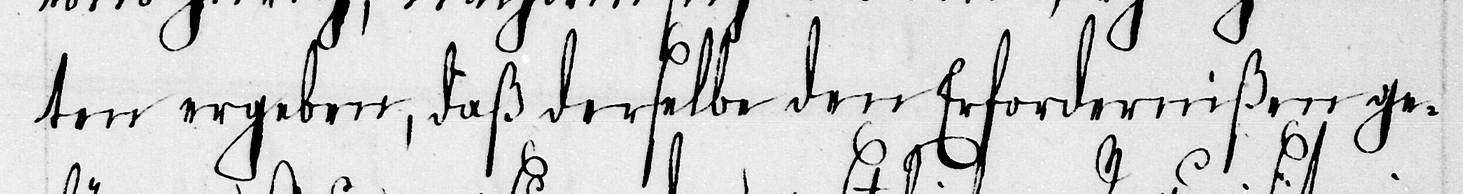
ten ergeben, daß derselbe den Erfordernißen ge¬
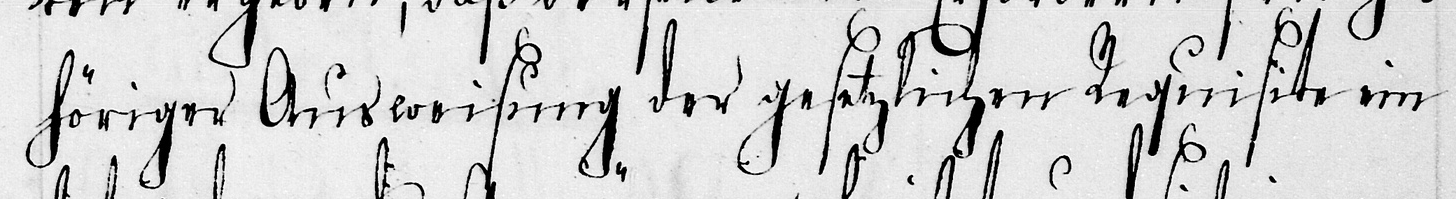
höriger Ausweisung der gesetzlichen Requisite ein
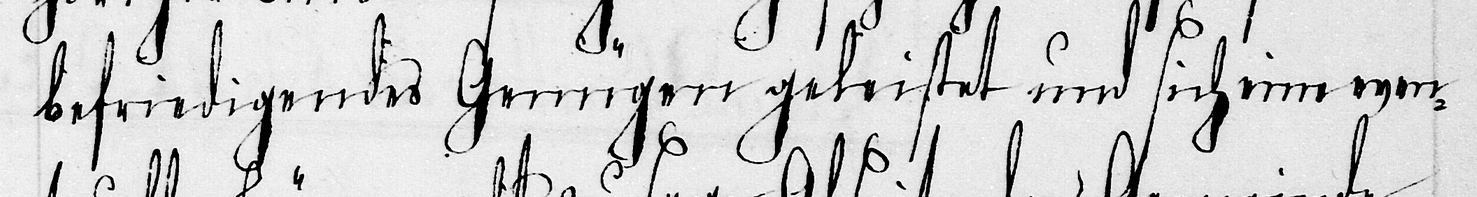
befriedigendes Genügen geleistet und sich eine even¬
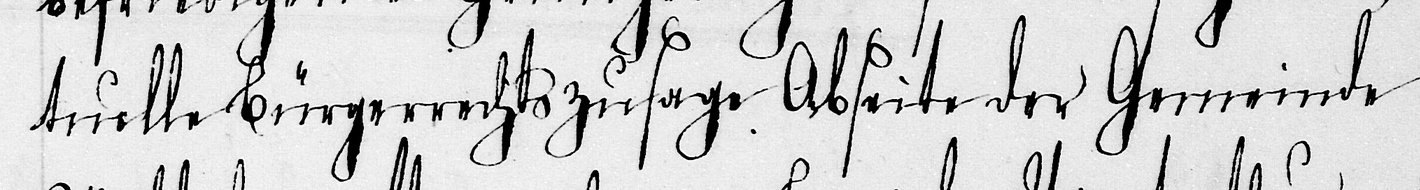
tuelle Bürgerrechtszusage Abseite der Gemeinde
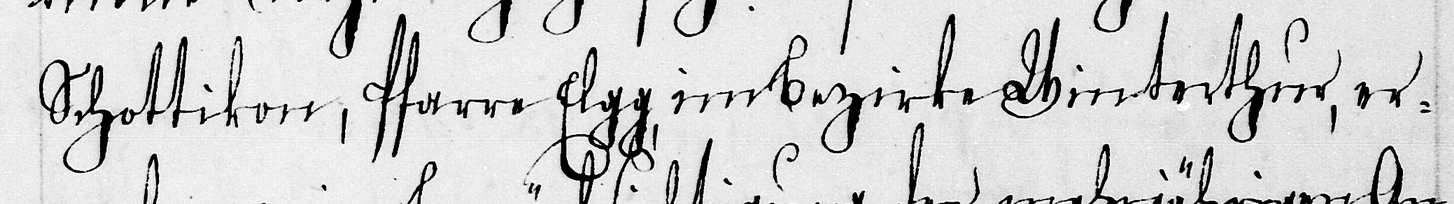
Schottikon, Pfarre Elgg, im Bezirke Winterthur, er¬
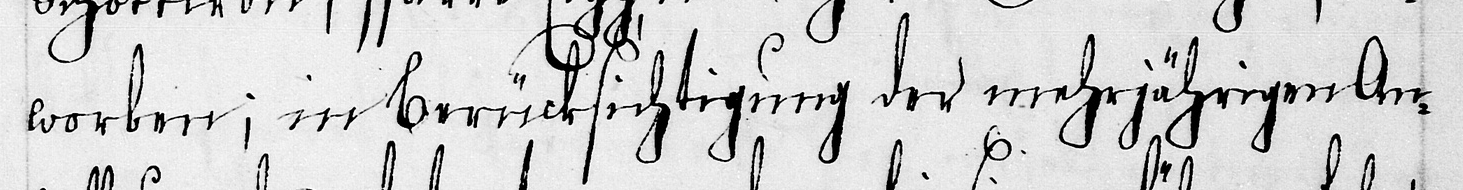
worben; in Berücksichtigung der mehrjährigen Ans¬
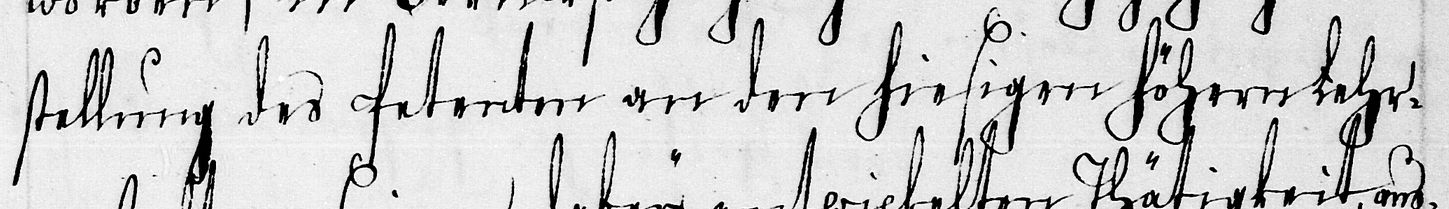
tellung des Petenten an den hiesigen höhern Lehr¬
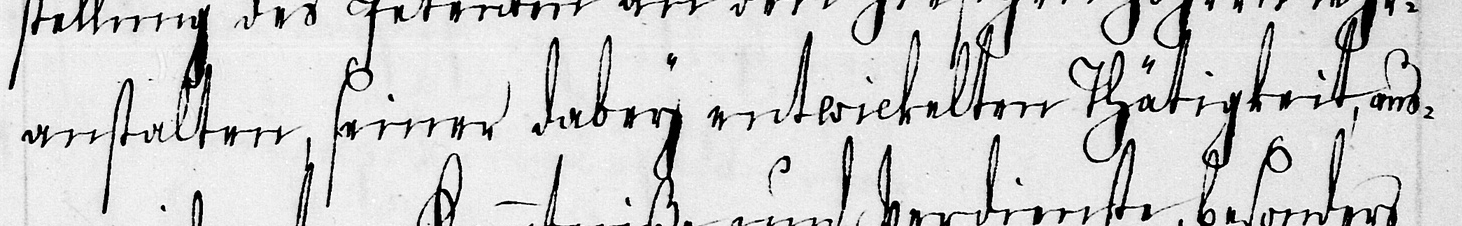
anstalten, seiner dabey entwickelten Thätigkeit, aus¬
